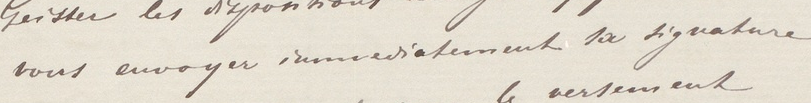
vous envoyer immediatement sa signature
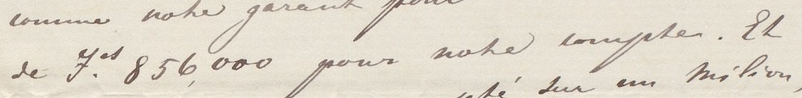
de Fcs 856,000 pour notre compte. Et
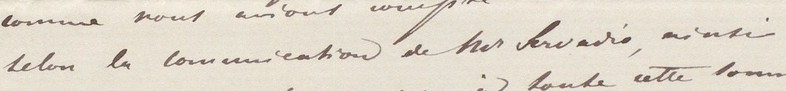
selon la communication de MrServadio, ainsi
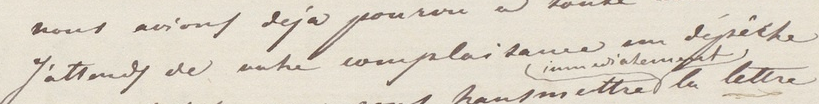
J'attends de votre complaisance une dépêche
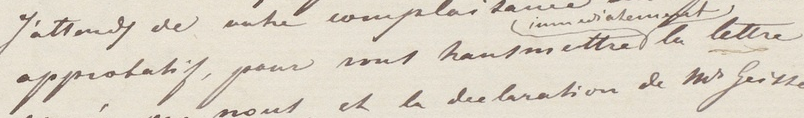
approbatif, pour vous transmettre immediatement la lettre
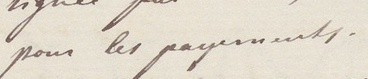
pour les payements.
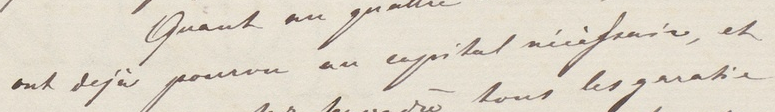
ont dejà pourvu un capital nécéssaire, et
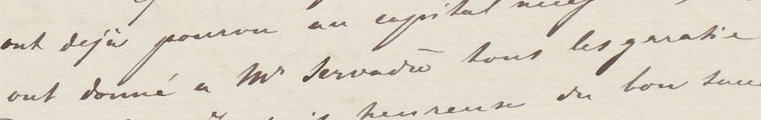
ont donné a MrServadio tous les garatie
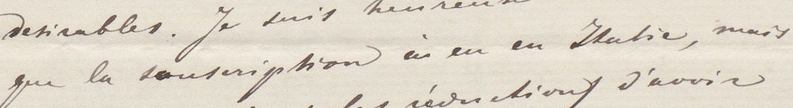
que la souscription à en eu Italie, mais
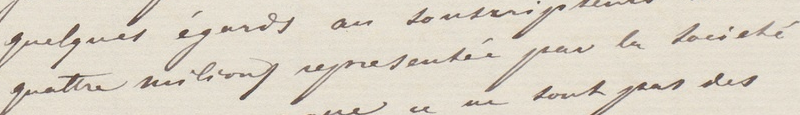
quattre milions representée par la societé
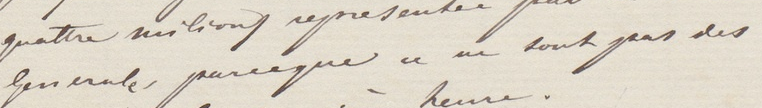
Generale, parceque ce ne sont pas des
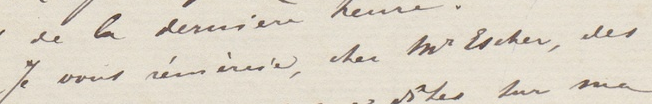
Je vous rémèrcie, cher Mr Escher, des
